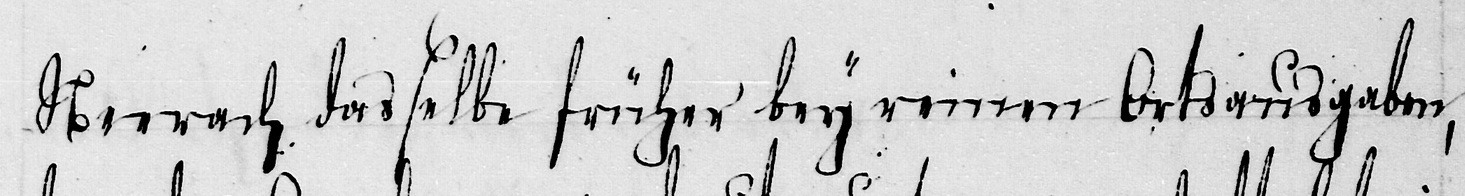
Neerach dasselbe früher bey reinen Ortsausgaben,
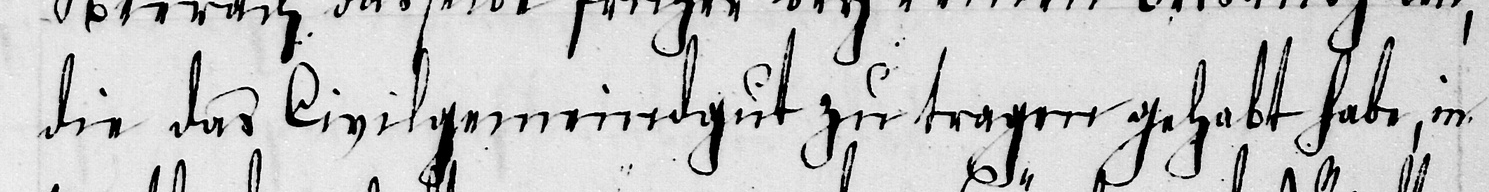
die das Civilgemeindgut zu tragen gehabt habe, in
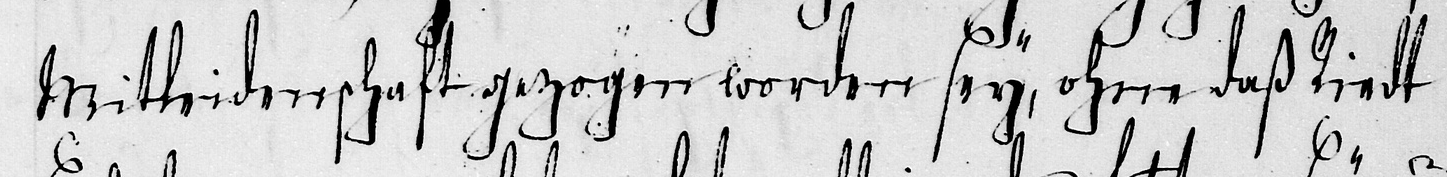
Mitleidenschaft gezogen worden sey, ohne daß Riedt
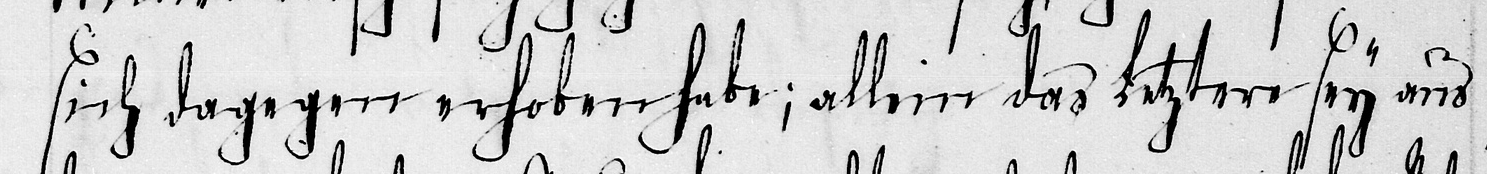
sich dagegen erhoben habe; allein das Letztere sey aus
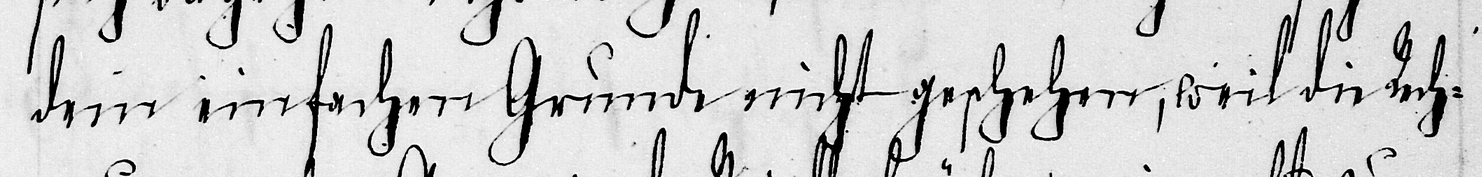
dem einfachen Grunde nicht geschehen, weil die Rec¬
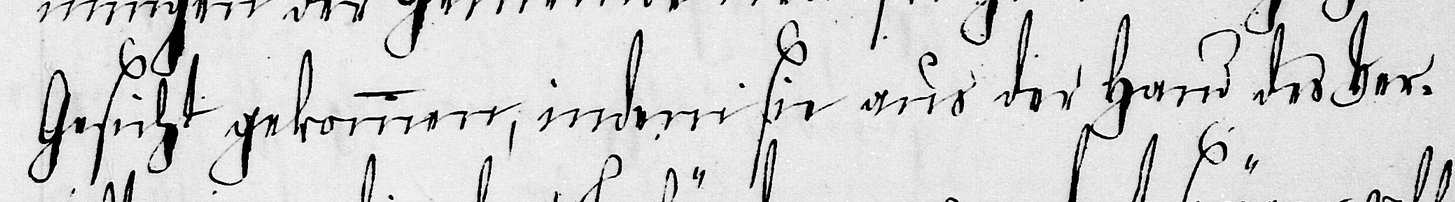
Gesicht gekommen, indem sie aus der Hand des Ver¬
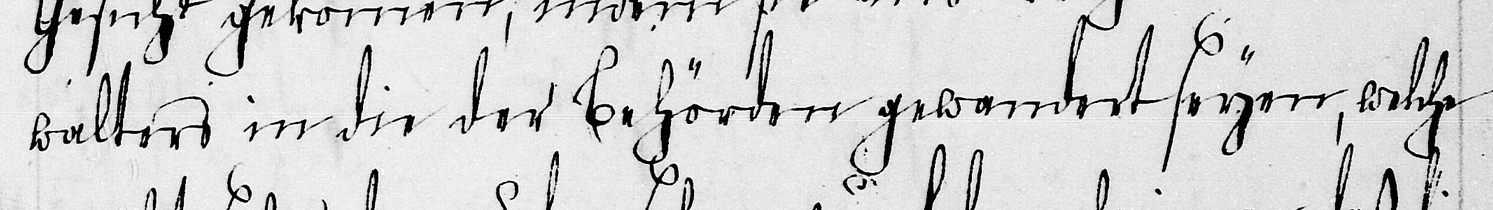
walters in die der Behörden gewandert seyen, welche
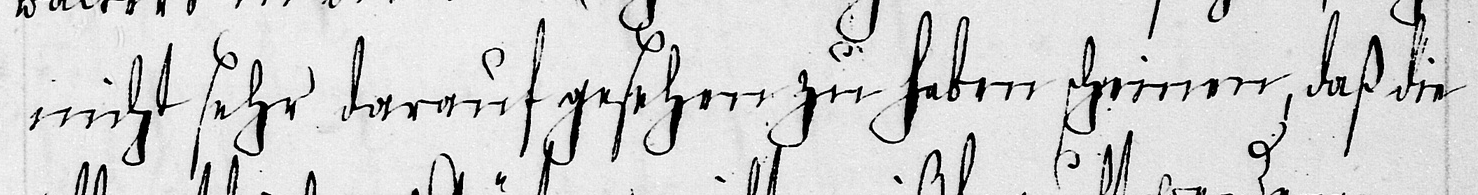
nicht sehr darauf gesehen zu haben scheinen, daß die
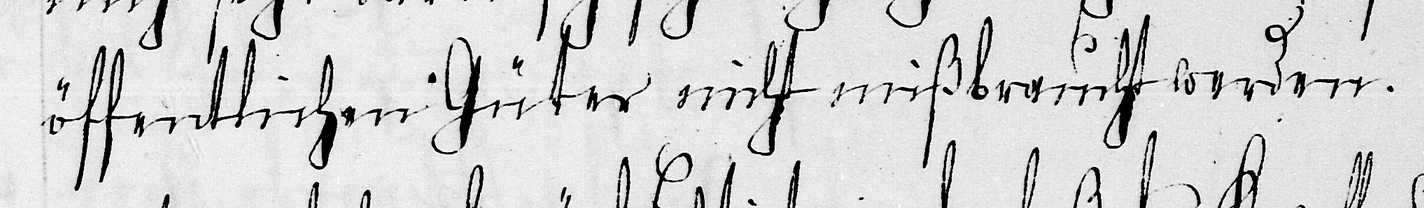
öffentlichen Güter nicht mißbraucht werden.
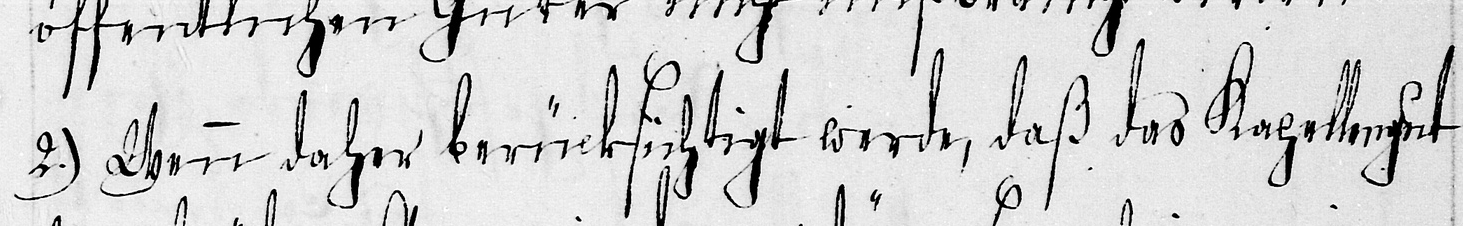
2.) Wenn daher berücksichtigt werde, daß das Kapellengut
